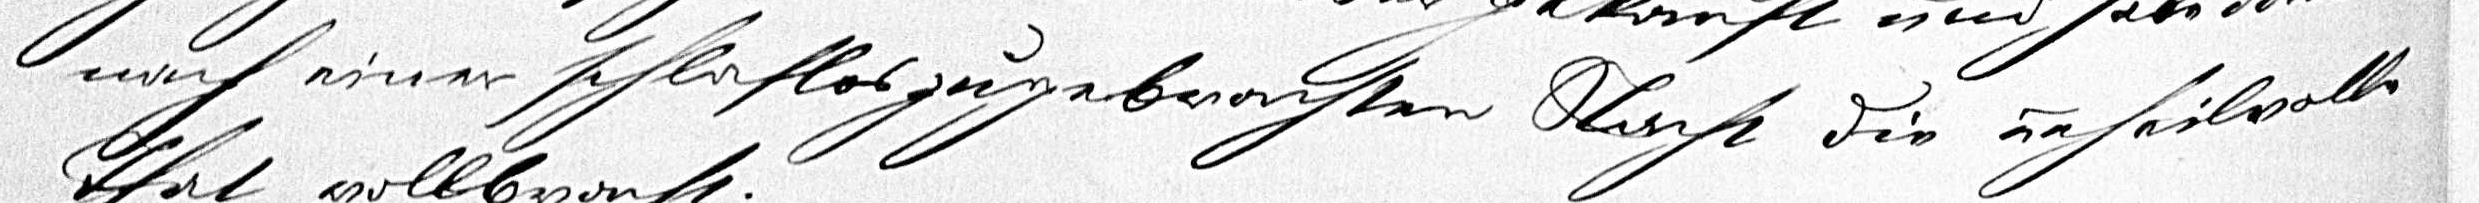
nach einer schlaflos zugebrachten Nacht die unheilvolle
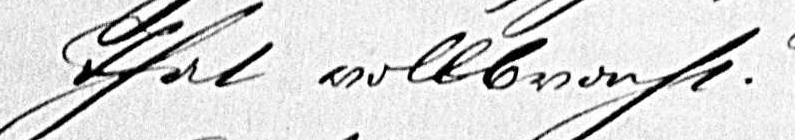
That vollbracht.
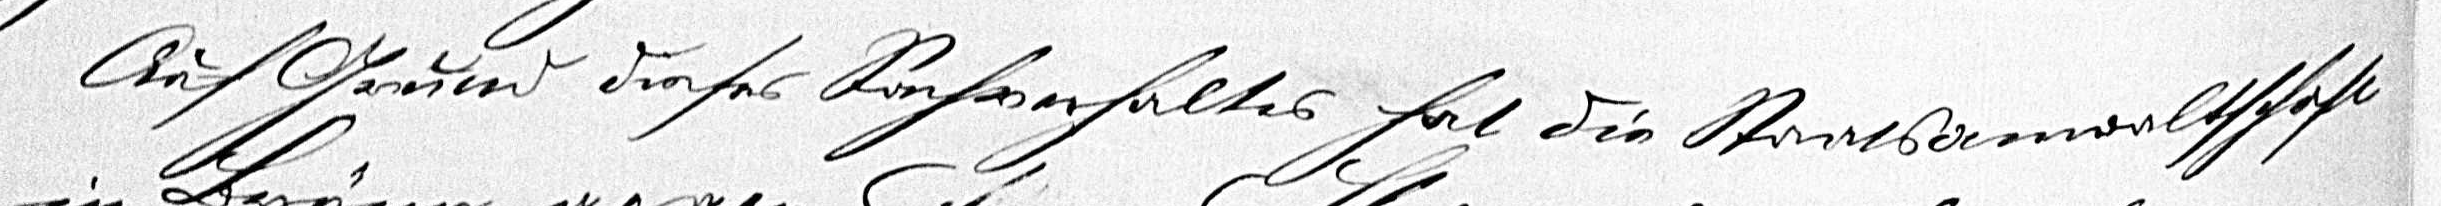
Auf Grund dieses Sachverhaltes hat die Staatsanwaltschaft
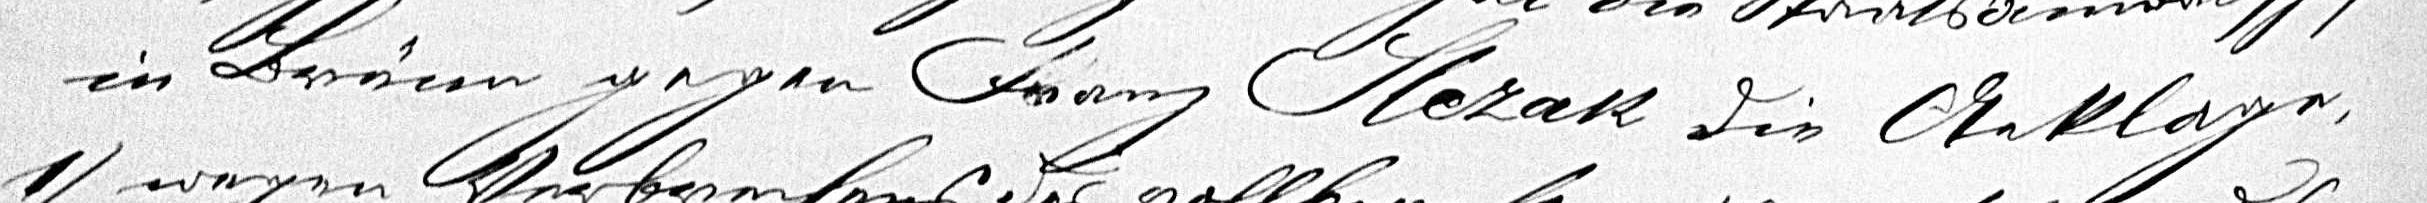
in Brünn gegen Franz Stezak die Anklage,
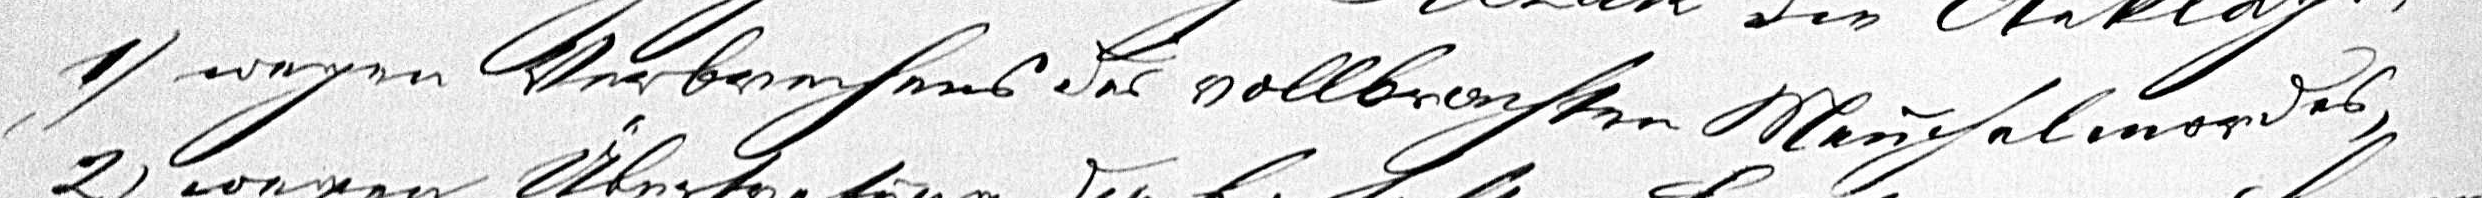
1) wegen Verbrechens des vollbrachten Meuchelmordes,
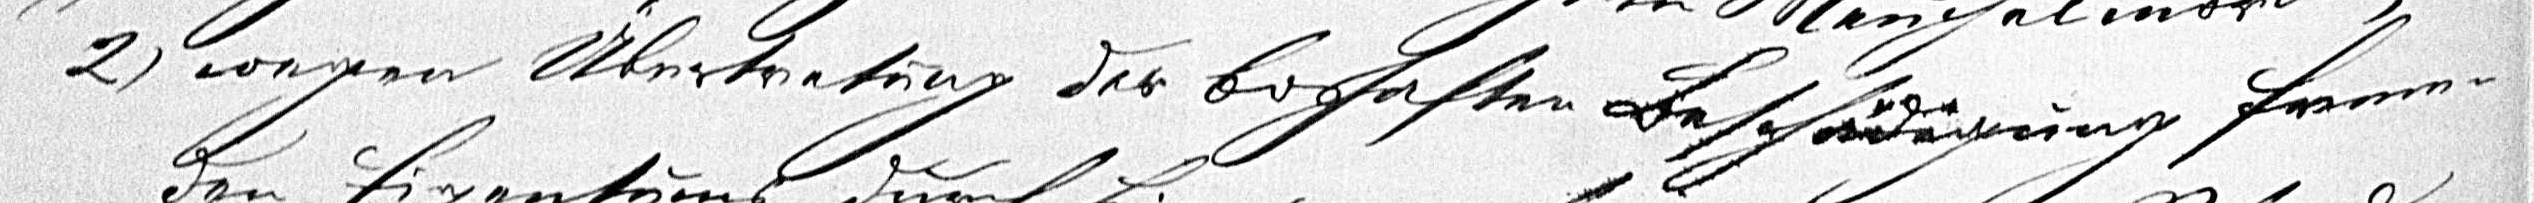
2) wegen Übertretung der boshaften Beschädigung Frem¬
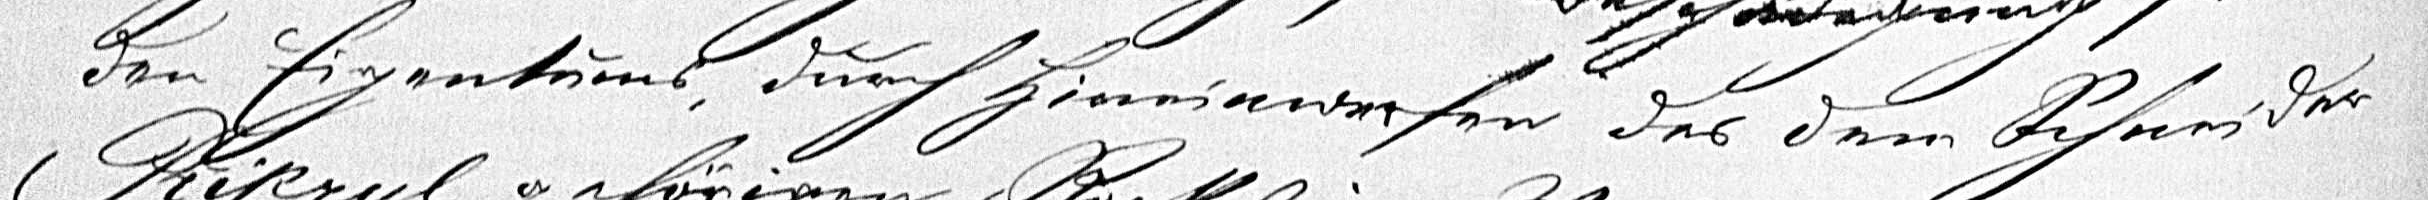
den Eigentums, durch Hineinwerfen des dem Schneider
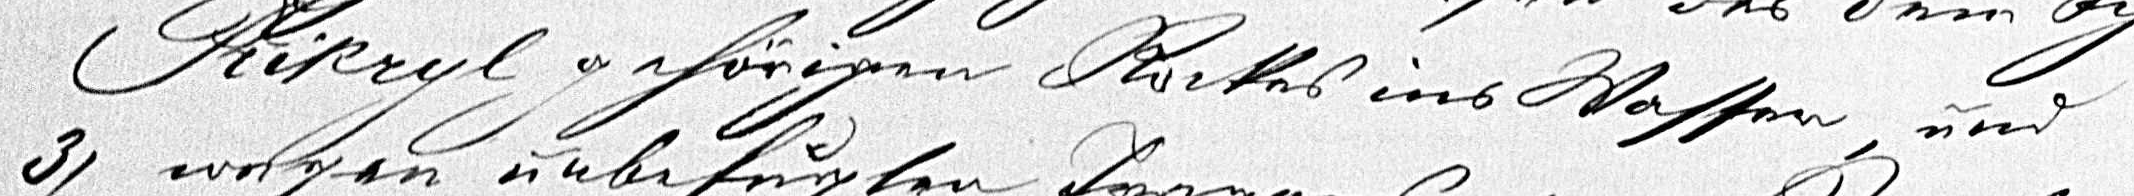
xx gehörigen Rockes ins Wassen, und
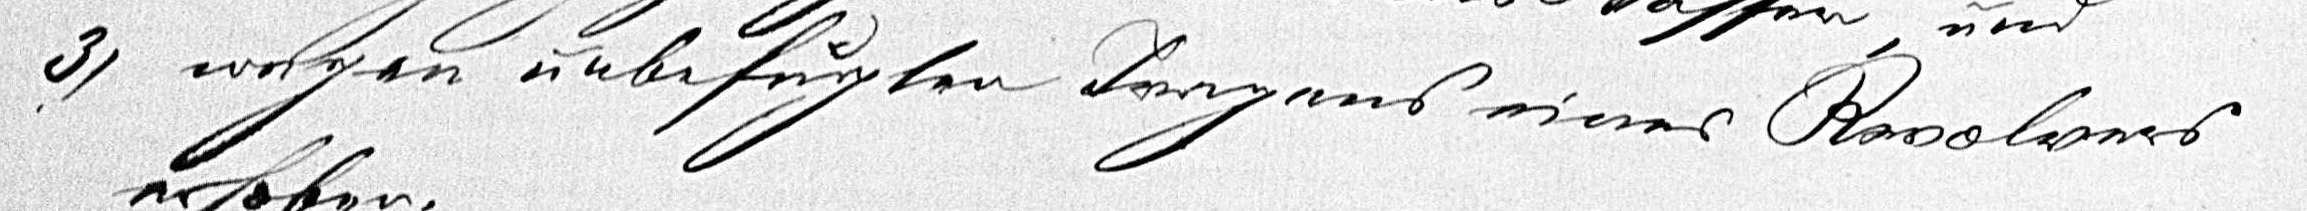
3) wegen unbefugten Tragens eines Revolvers
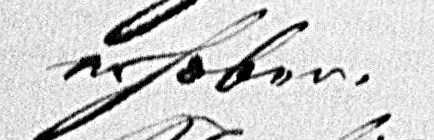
erhoben.
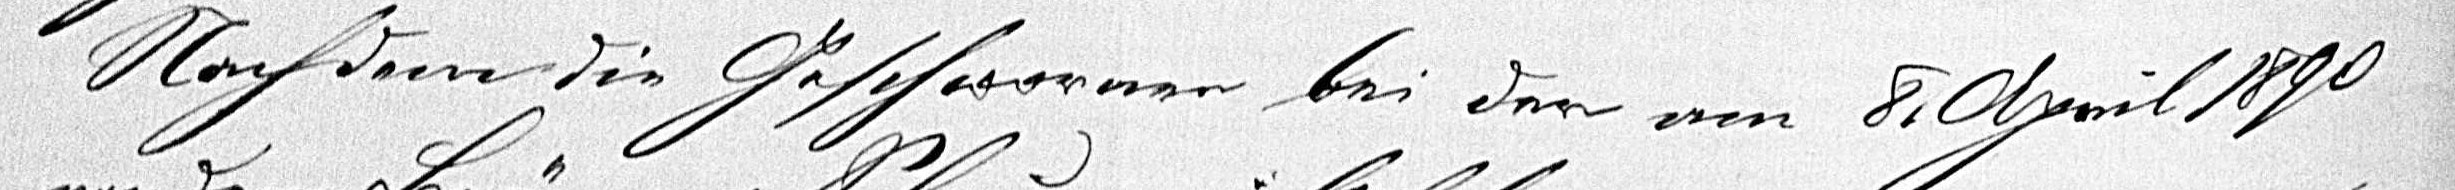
Nachdem die Geschwornen bei der am 8. April 1890
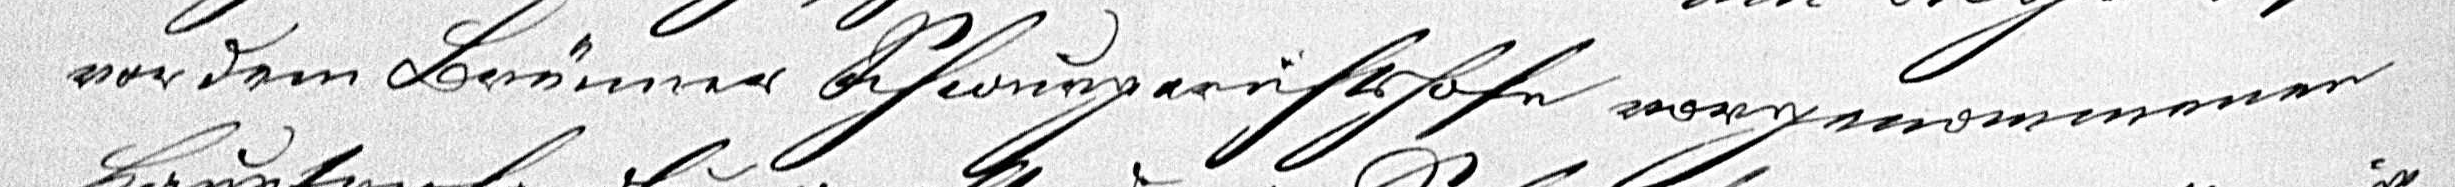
vor dem Brünner Schwurgerichtshofe vorgenommenen
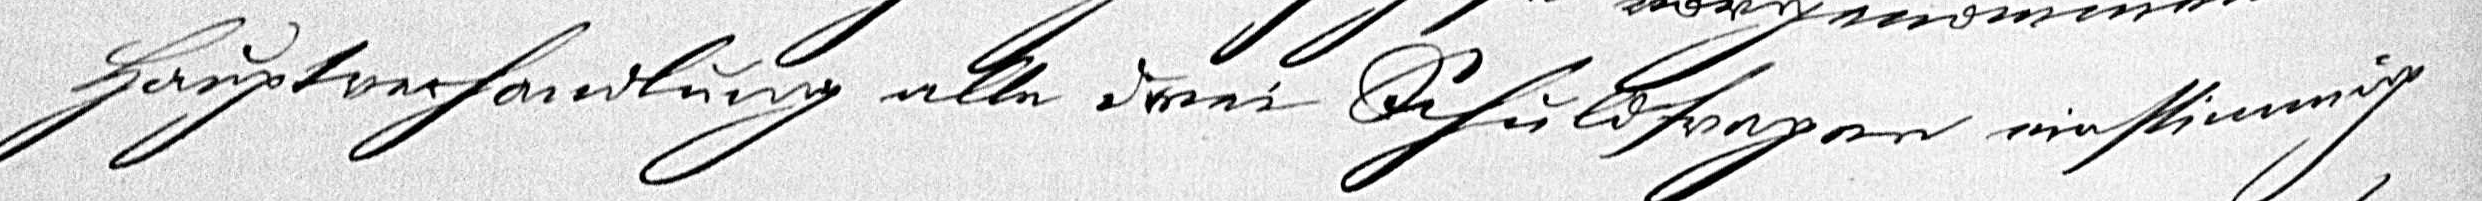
Hauptverhandlung alle drei Schuldfragen einstimmig
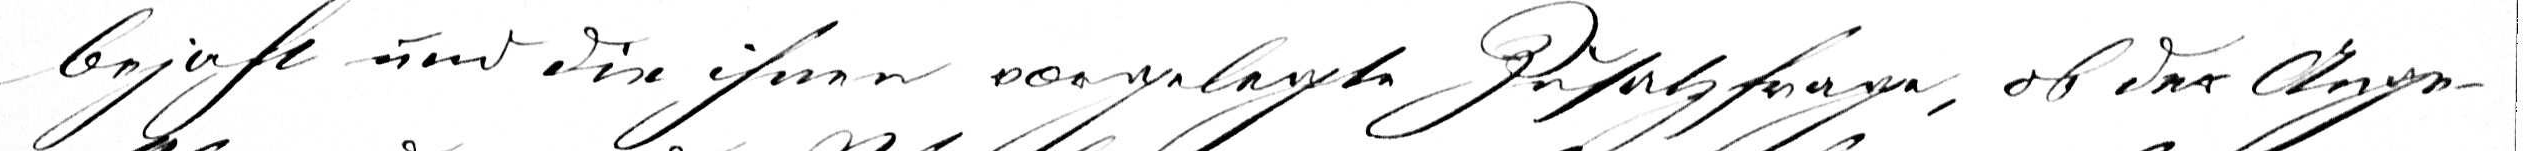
bejaht und die ihnen vorgelegte Zusatzfrage, ob der Ange¬
